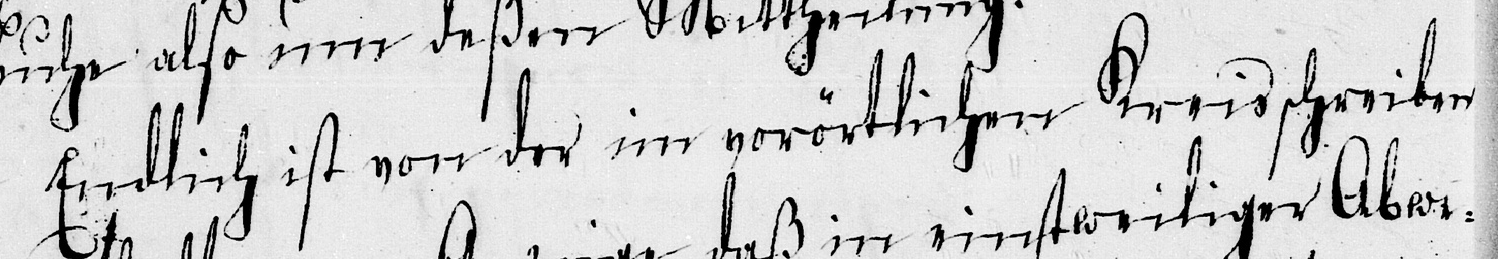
Endlich ist von der im vorörtlichen Kreisschreiben
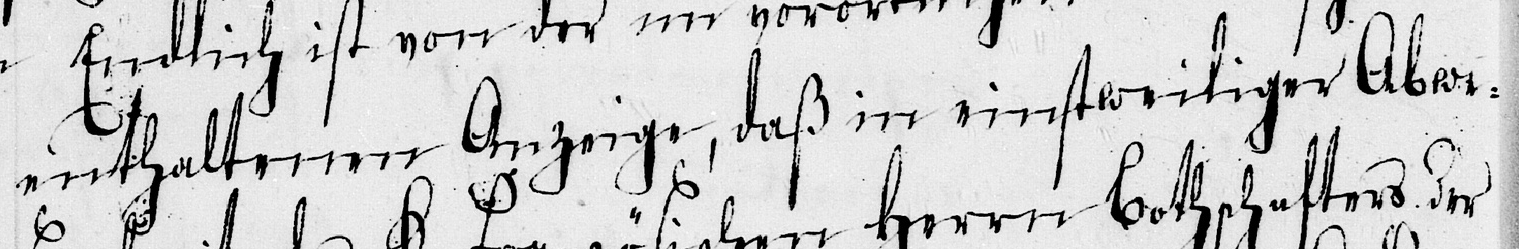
enthaltenen Anzeige, daß in einstweiliger Abwe¬
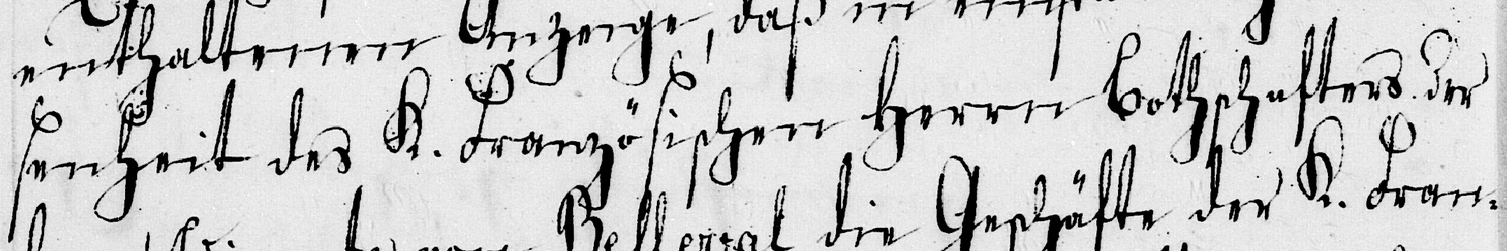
senheit des K. Französischen Herrn Bothschafters der
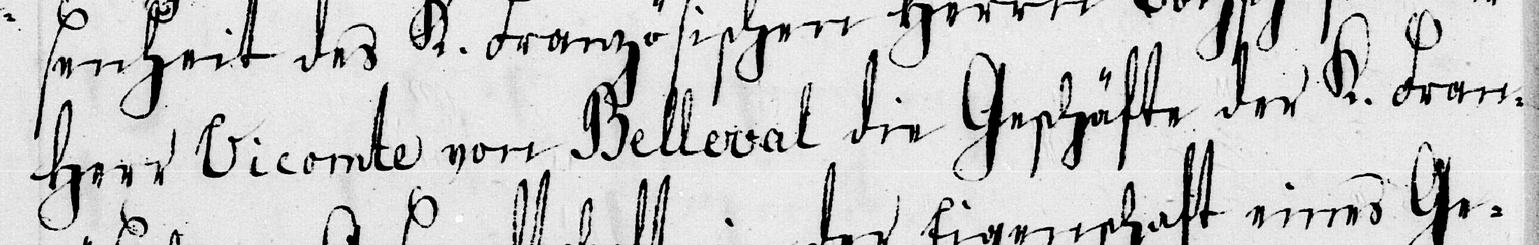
Herr Vicomte von Belleval die Geschäfte der K. Fran¬
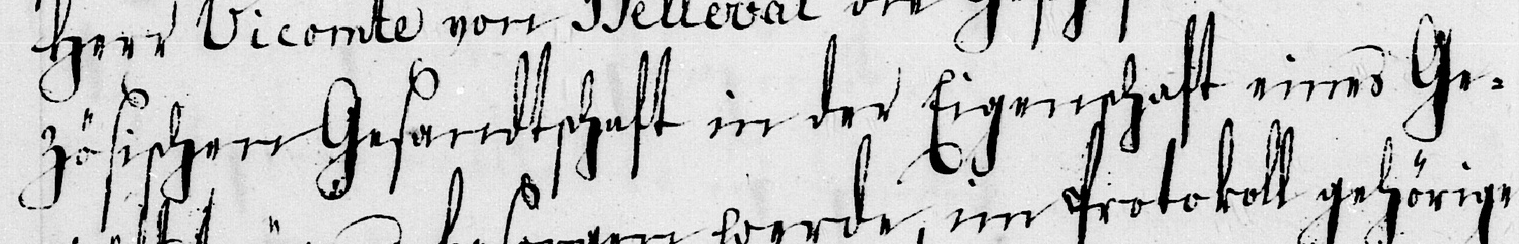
zösischen Gesandtschaft in der Eigenschaft eines Ge¬
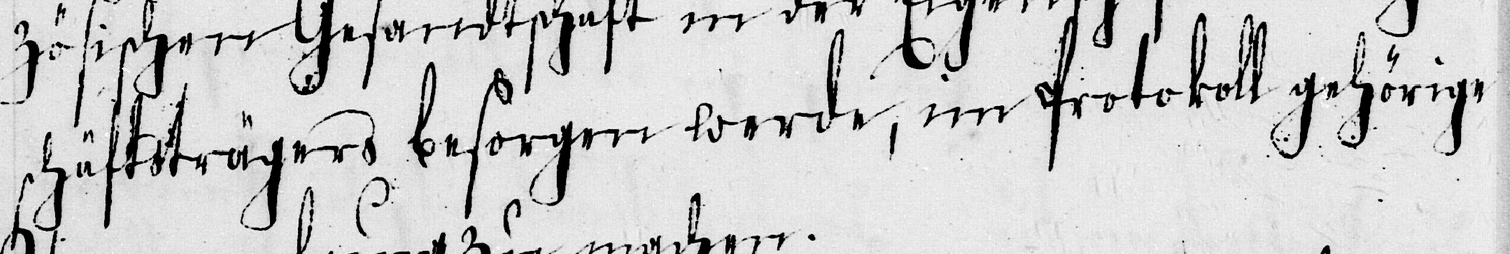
schäftsträgers besorgen werde, im Protokoll gehörige
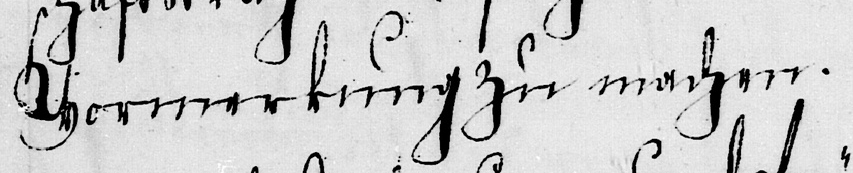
Vormerkung zu machen.
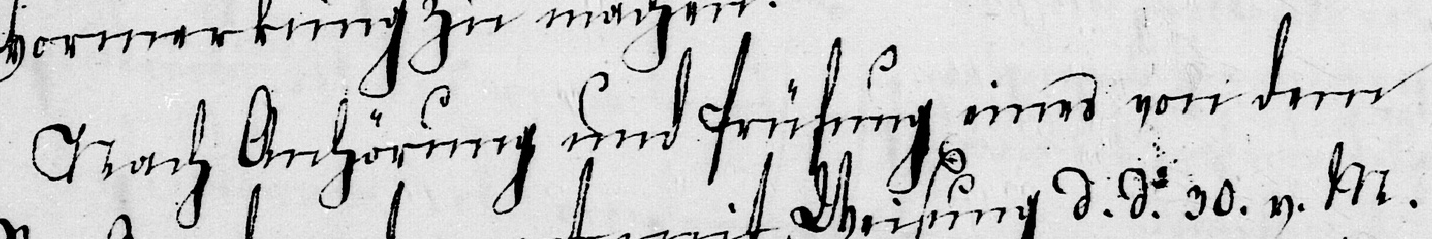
Nach Anhörung und Prüfung eines von dem
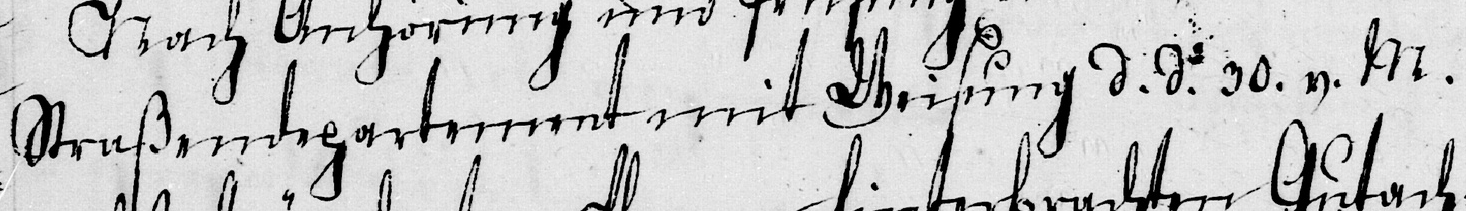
Straßendepartement mit Weisung d. d. 30. v. M.
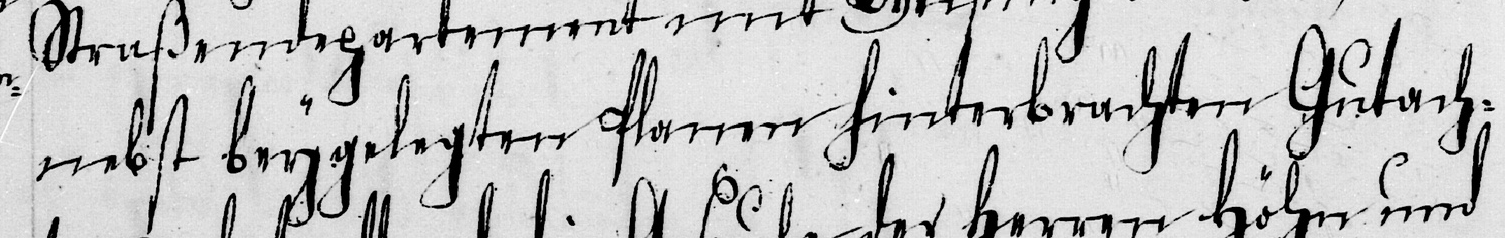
nebst beygelegten Planen hinterbrachten Gutach¬
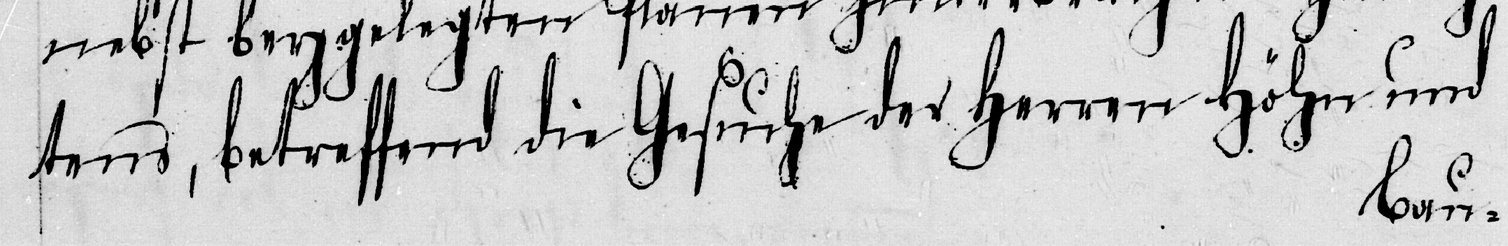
tens, betreffend die Gesuche der Herren Höhn und
